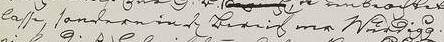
lasse, sondern in den Bereich mr Würdigg.
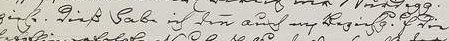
ziehe. Dieß habe ich denn auch mit Beziehg. auf die
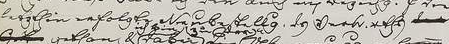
letzthin erfolgte Neubestellg. ds Verw.rths der
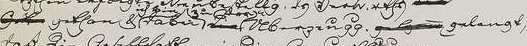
G.B. gethan & ich bin dabei diezu der Überzeugg. gewonnen gelangt,
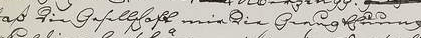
daß die Gesellschaft mir die Genugthuung
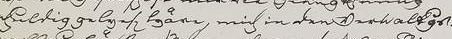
schuldig gewesen wäre, mich in den Verwaltungs-
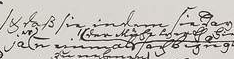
werth hielt, sachbezügliche
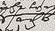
begangen
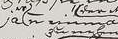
daß, was die
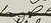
aber nichtetwa
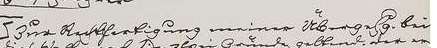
Zur Rechtfertigung meiner Übergehung bei
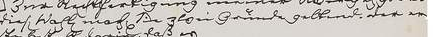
diesen Wahlen machen Sie zwei Gründe geltend. Der er-
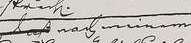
darin, daß es nach meinem
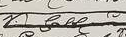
diesen Wahlen machen
